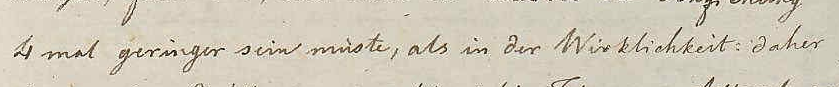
4 mal geringer sein müste, als in der Wirklichkeit: daher
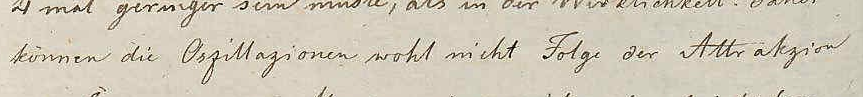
können die Oszillazionen wohl nicht Folge der Attrakzion
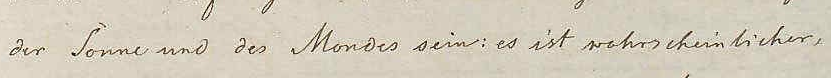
der Sonne und des Mondes sein: es ist wahrscheinlicher,
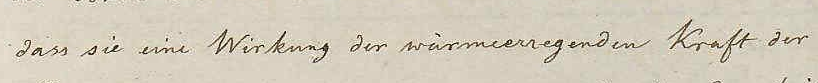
dass sie eine Wirkung der wärmeerregenden Kraft der
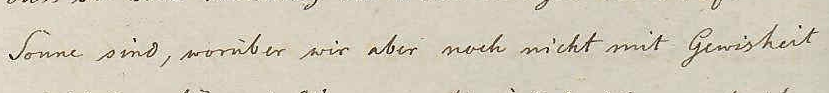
Sonne sind, worüber wir aber noch nicht mit Gewisheit
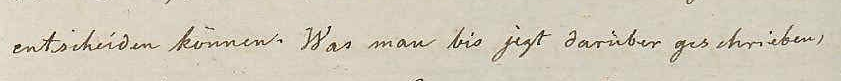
entscheiden können. Was man bis jezt darüber geschrieben,
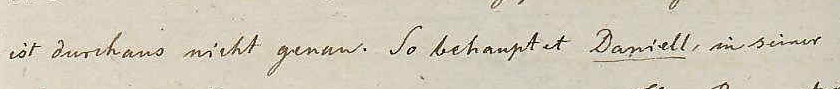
ist durchaus nicht genau. So behauptet Daniell, in seiner
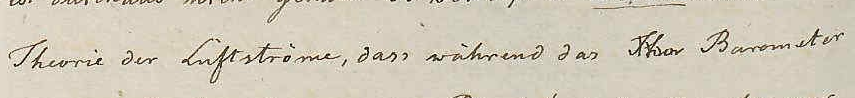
Theorie der Luftströme, dass während das TherBarometer
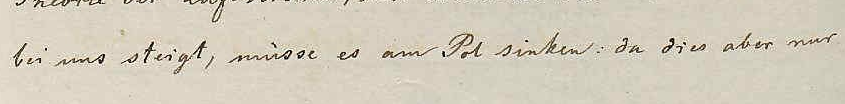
bei uns steigt, müsse es am Pol sinken: da dies aber nur
